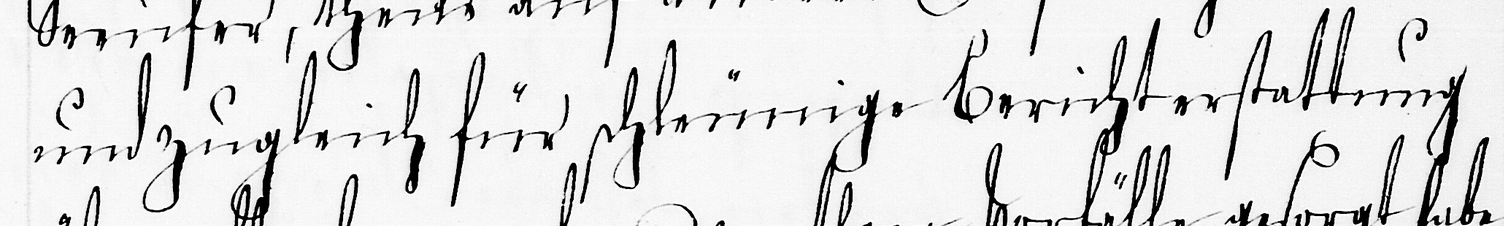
und zugleich für schleunige Berichterstattung
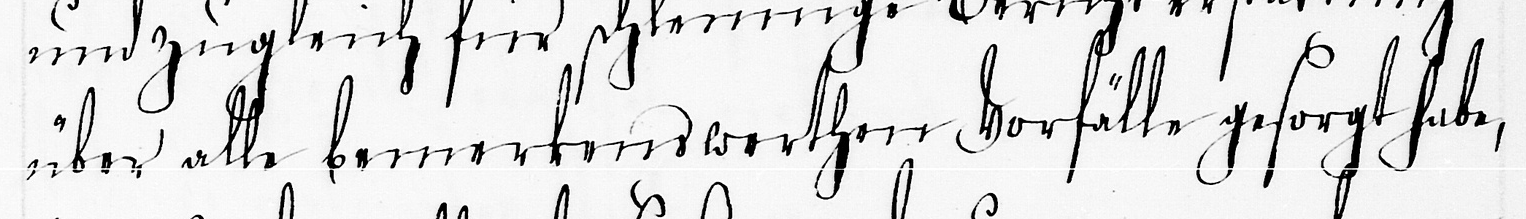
über alle bemerkenswerthen Vorfälle gesorgt habe,
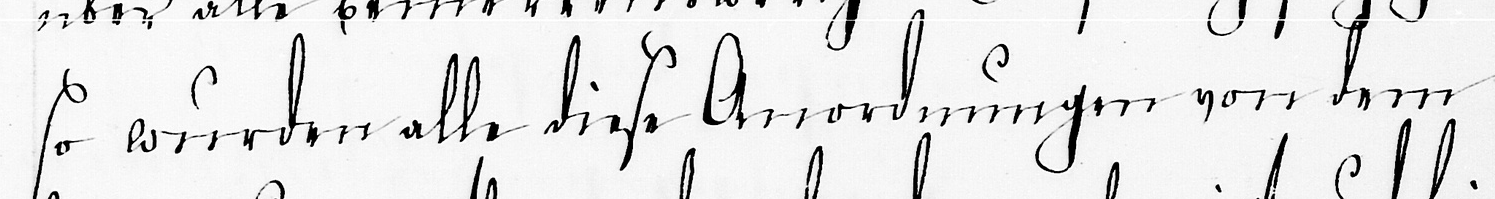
so wurden alle diese Anordnungen von dem
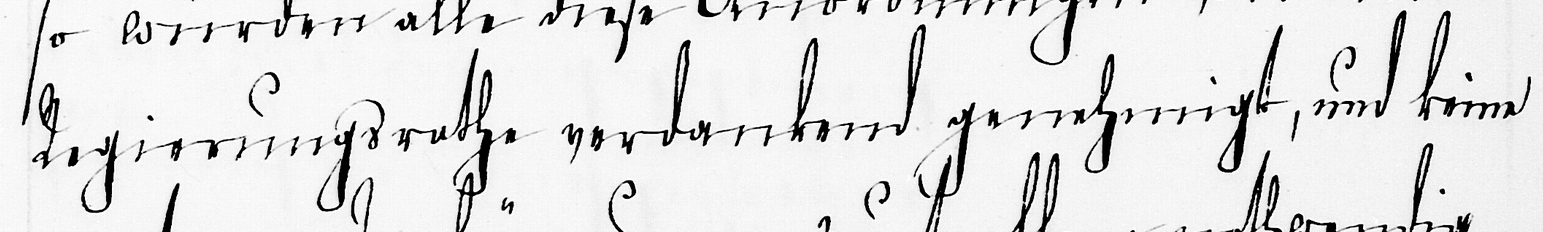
Regierungsrathe verdankend genehmigt, und keine
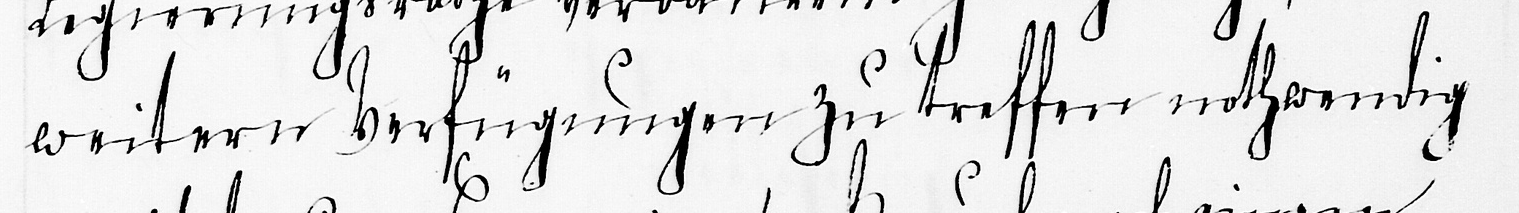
weitern Verfügungen zu treffen nothwendig
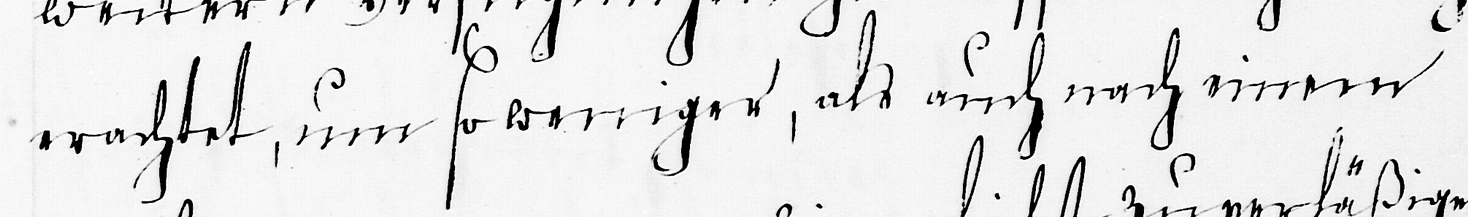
erachtet, um so weniger, als auch nach einem
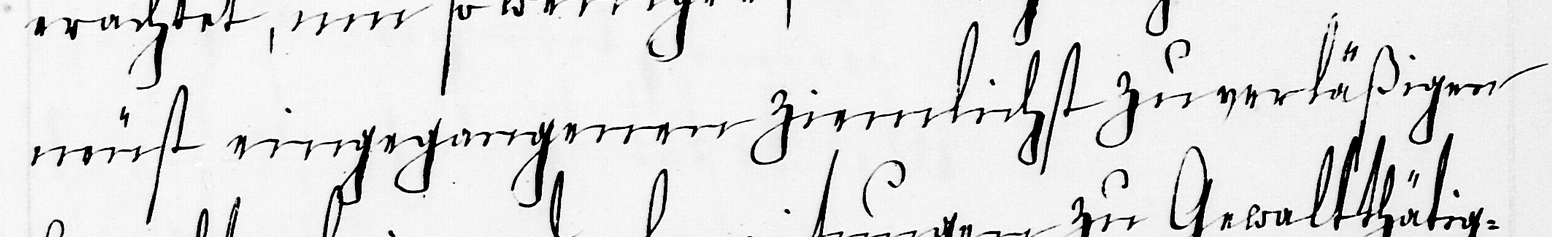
neust eingegangenen ziemlichst zuverläßigen
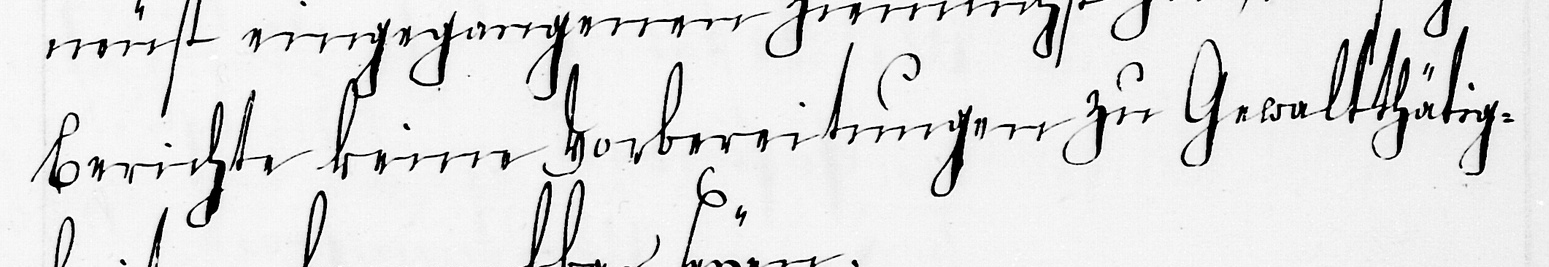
Berichte keine Vorbereitungen zu Gewaltthätig¬
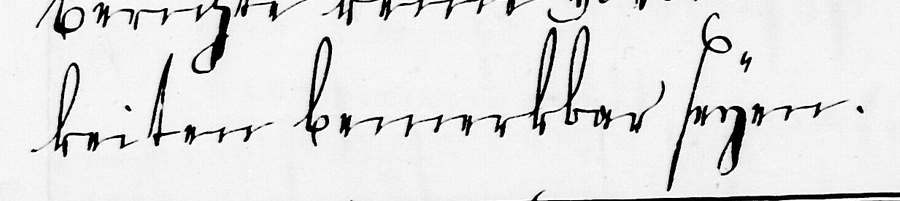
keiten bemerkbar seyen.
